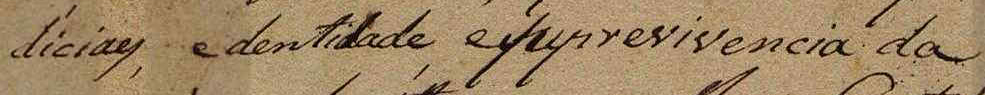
diciaes edentidade, e suprevivencia da
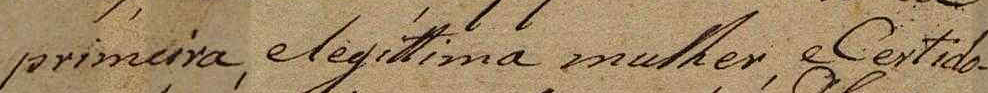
primeira e legittima mulher, e Certido
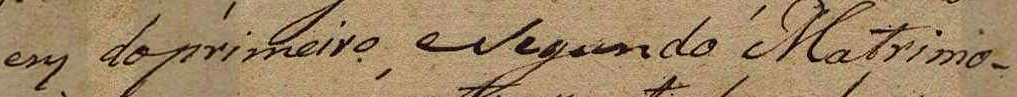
ens do primeiro, e segundo Matrimo
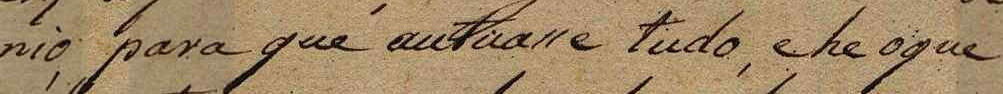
nio, para que autuasse tudo, e he o que
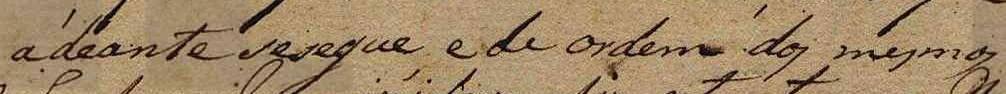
adeante se segue, e de ordem dos mesmos
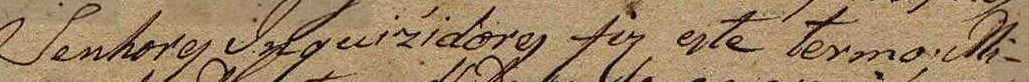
Senhores Inquizidores fiz este termo; Mi
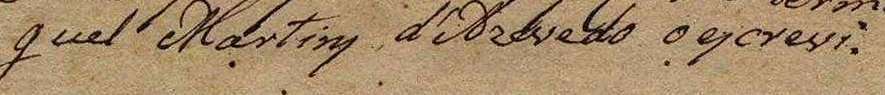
guel Martins d'Azevedo o escrevi:
